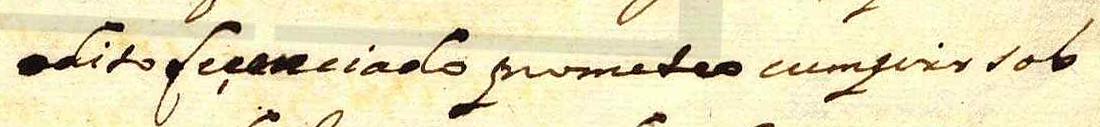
o dito Lecenciado prometeo cumprir, sob
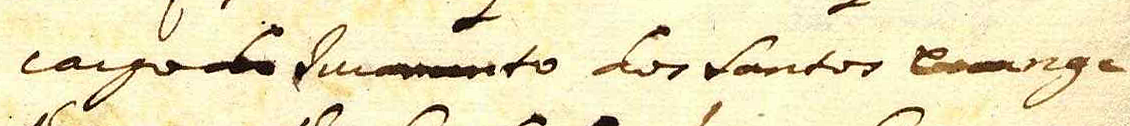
cargo do Iuramento dos santos euange
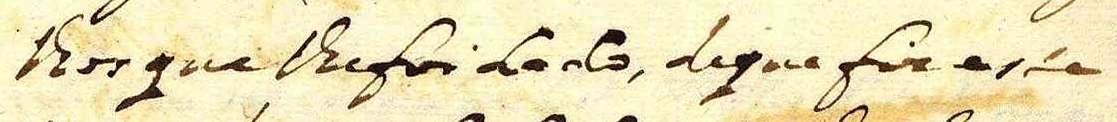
lhos que lhe foi dado, de que fiz este
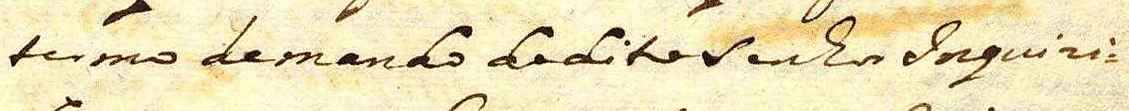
termo de mando do dito senhor Inquizi
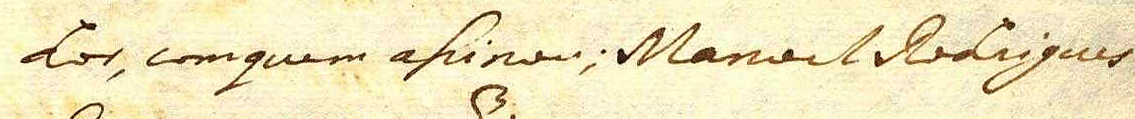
dor, com quem assinou; Manoel Rodrigues
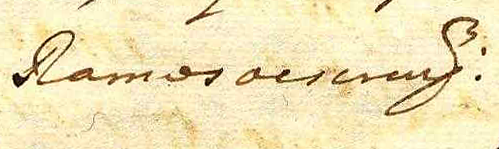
Ramos o escreuj:
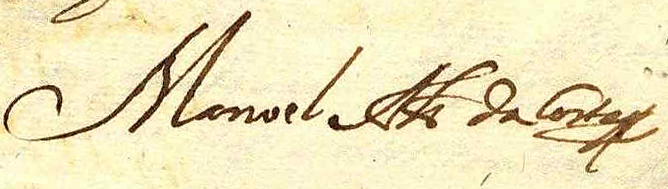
Manoel Alz̄ da Costa
